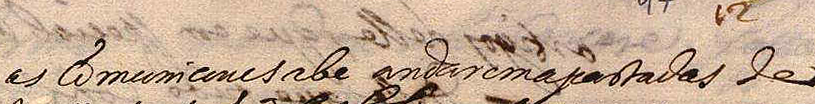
as cōmunicou e sabe andarem apartadas de
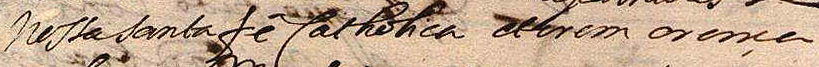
nossa santa fê Catholica e terem crença
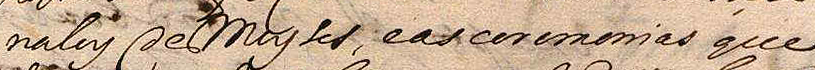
na ley de Moyses, e as ceremonias que
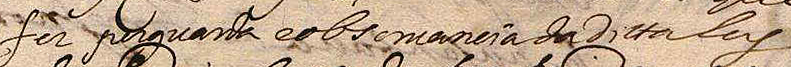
fez por guarda e obseruancia da ditta Ley
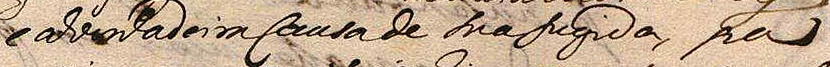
e a verdadeira Causa de sua fugida, pa
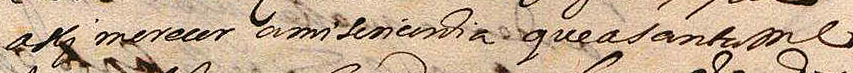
assj merecer a misericordia que a santa me
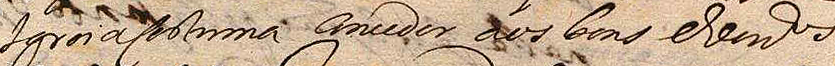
Igreia Costuma conceder aos bons e verdos
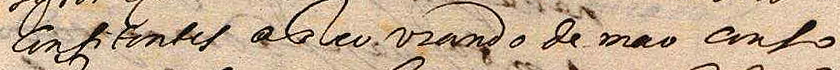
confitentes o Reo vzando de mao conso
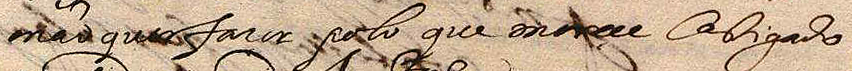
o naõ quer fazer polo que merece Castigado
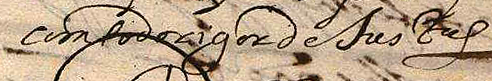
com todo rigor de Justas
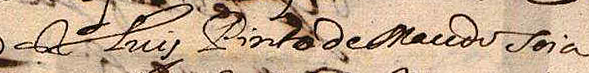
o R Luis Pinto de Macedo seia
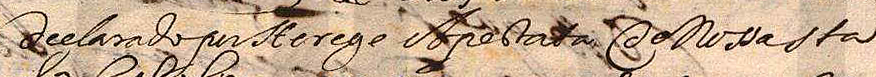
declarado por Herege Apostata da nossa sta
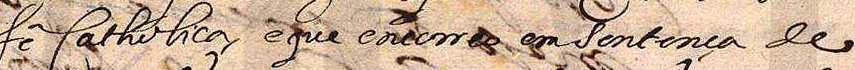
fê Catholica, e que encorreo em sentença de
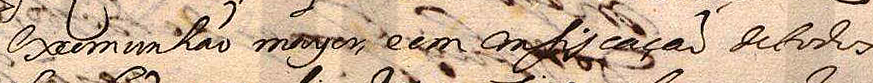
excomunhaõ mayor, e em confiscaçaõ de todos
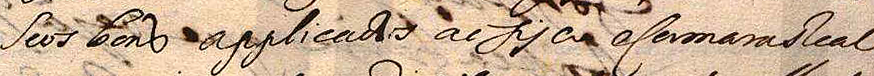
seos bens applicados ao fisco e Camara Real
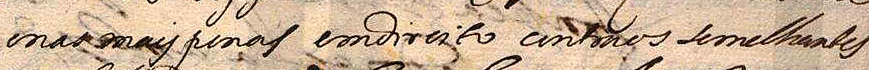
e nas mais penas em direito contra os semelhantes
